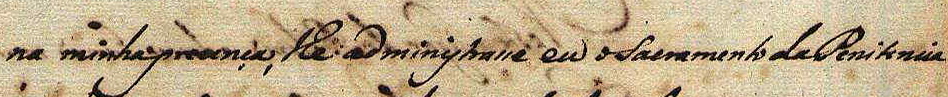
na minha prezença, lhe administrasse eu o Sacramento da Penitencia
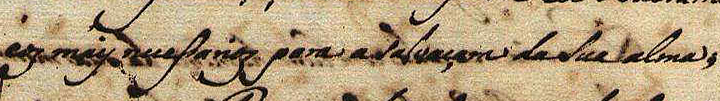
e oz mais necessarioz para a salvaçam da sua alma,
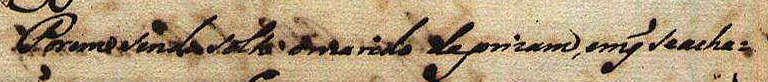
Porem sendo solto o marido da prizam, em q̄ se acha
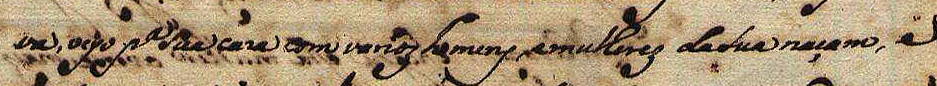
va, veyo p.a sua caza com varioz homens, e mulherez da sua naçam, e
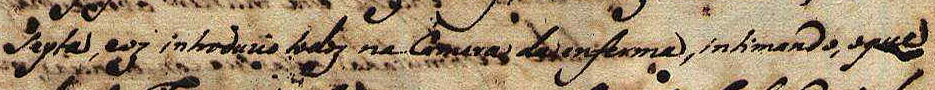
seyta, e oz introduzio todoz na Camera da enferma, intimando, o que
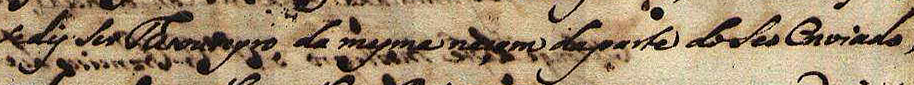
se dis ser Thezoureyro da mesma naçam da parte do Seo Enviado,
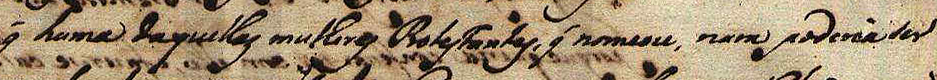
q̄ huma daquellaz mulheres Protestantes, q̄ nomeou, nam poderia ser
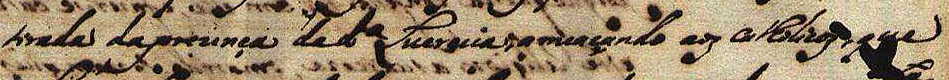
tirada da prezença da da Lucrecia, amençando aoz catholicoz, que
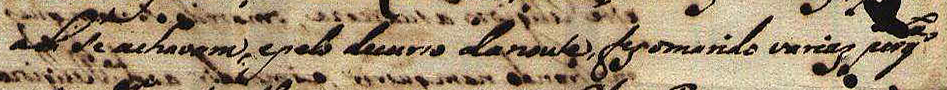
ali se achavam, e pelo decurso da noute, fez o marido variaz pergtas
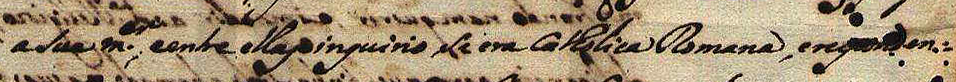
a sua m.er, e entre ellas inquirio se era Catholica Romana, e responden
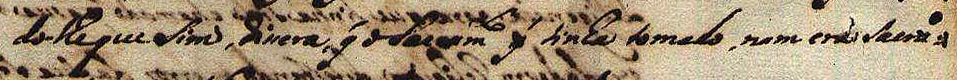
dolhe que Sim, dissera q̄ o Sacram.to q̄ tinha tomado, nam era Sacra
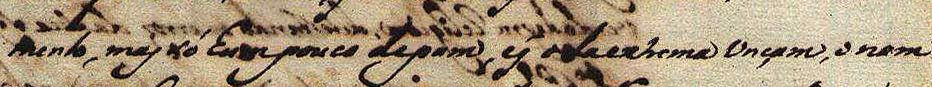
mento, mas só hum pouco de pam, e q̄ o da extrema Vnçam, o nam
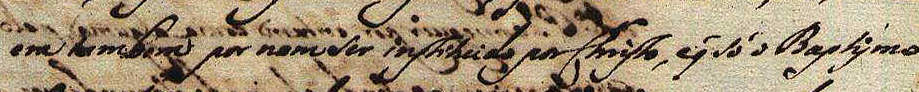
era tambem por nem ser instituido por Christo, e q̄ só o Baptismo
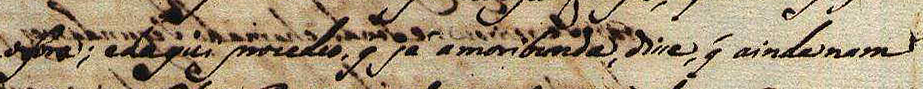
o fora; e daqui procedeo, q̄ já a moribunda, disse, q̄ ainda nam
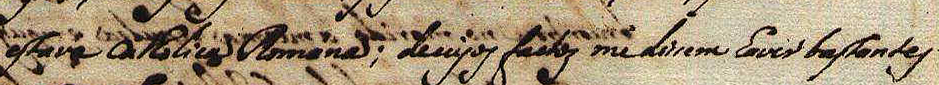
estava catholica Romana; de cujos factoz me dissem haver bastantes
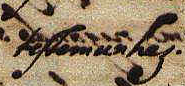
testemunhaz.
